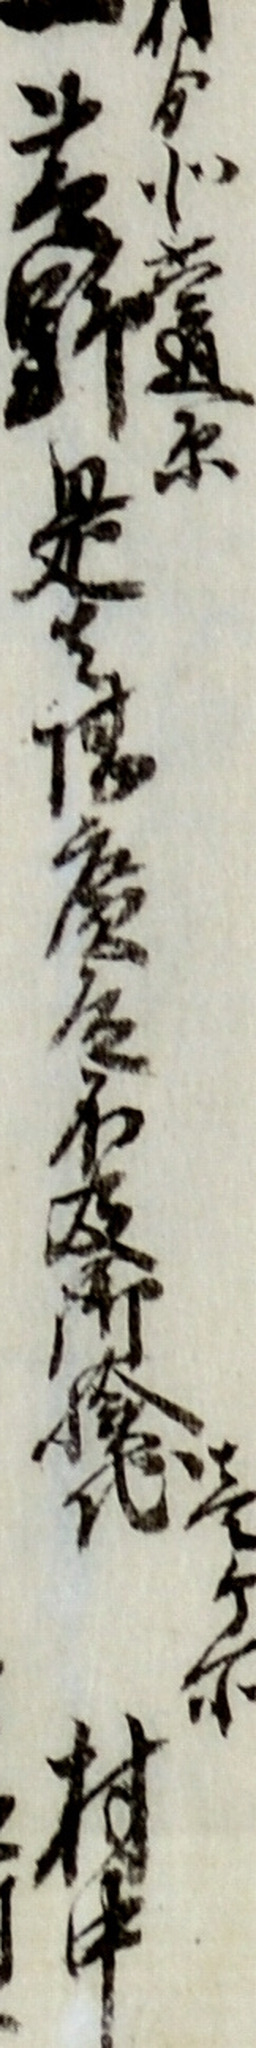一芝野是ハ場広故不及御検地村中
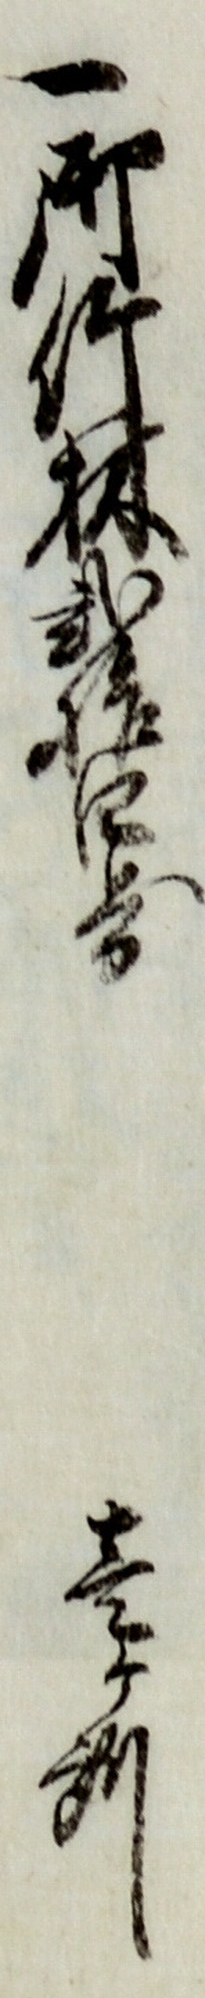一御竹林二拾四歩壱ヶ所

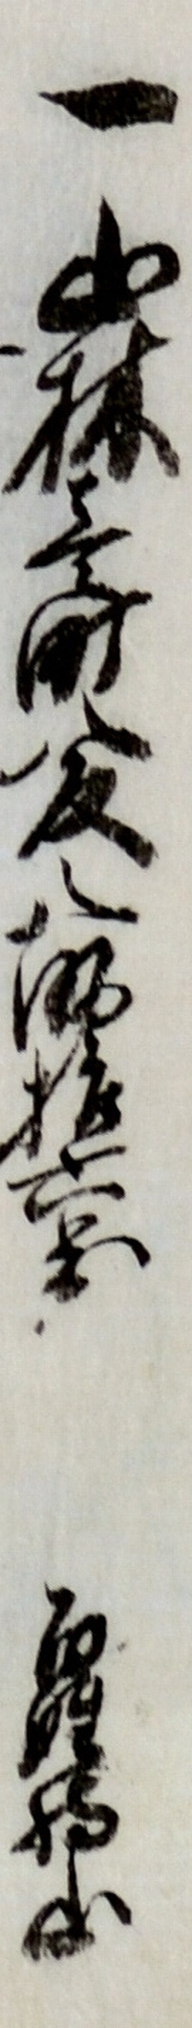一山林壱町八反八畝拾六歩百姓持山
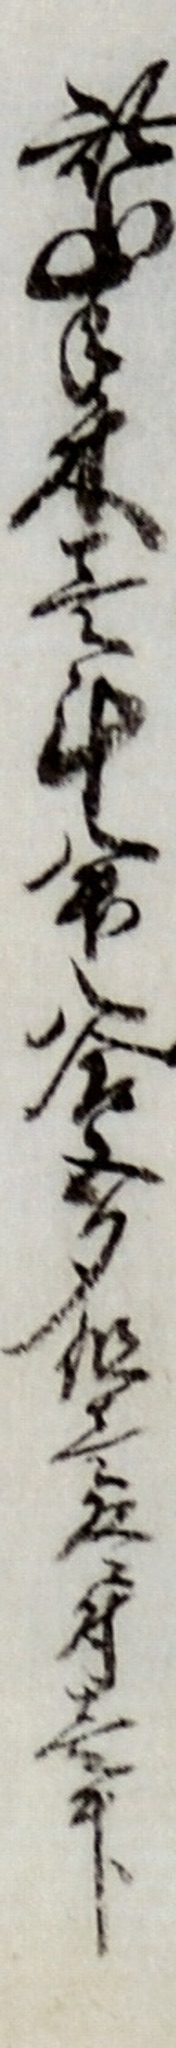此山手米壱斗八升八合五勺但壱反ニ付壱升
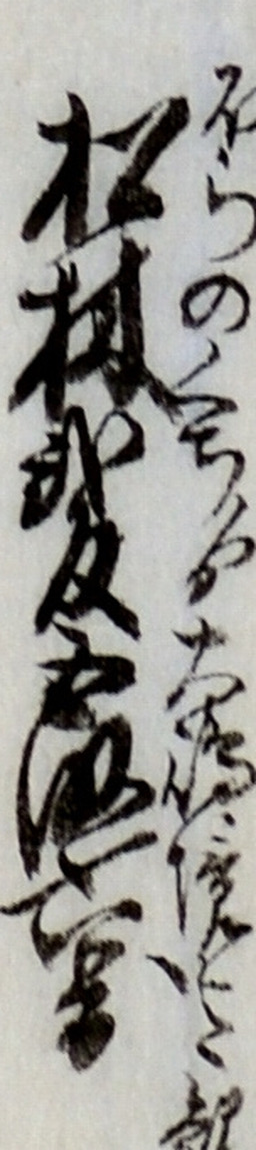松林弐反五畝六歩村中
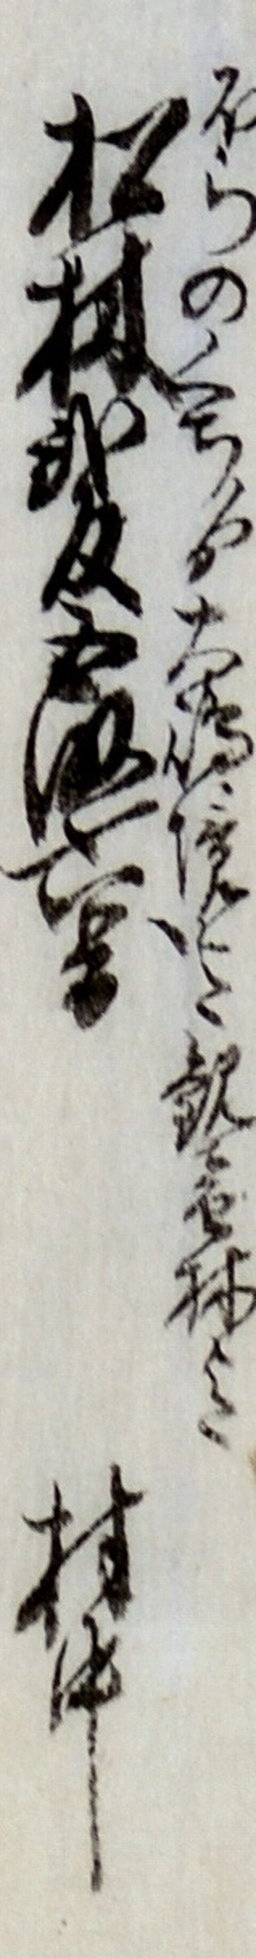松林弐反五畝六歩村中
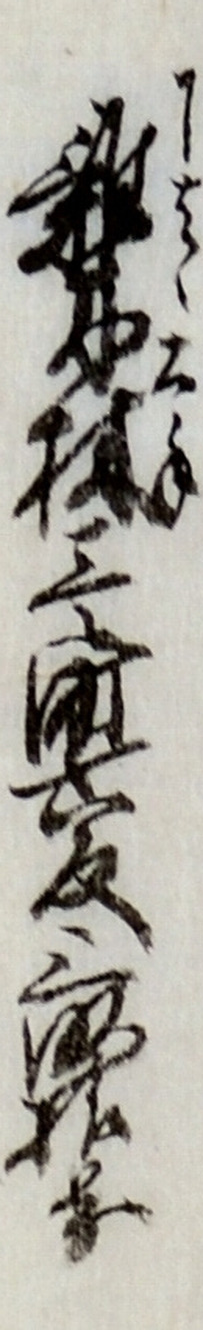雑木林壱町六反三畝拾歩同断
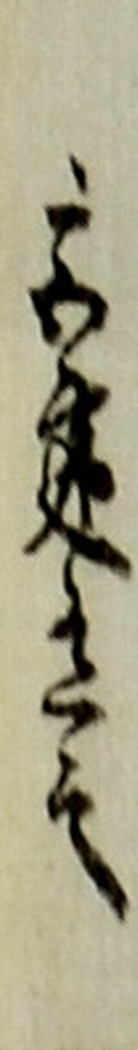宮建有之
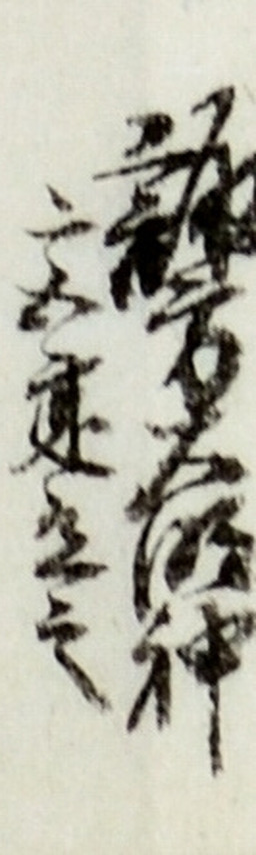宮建有之
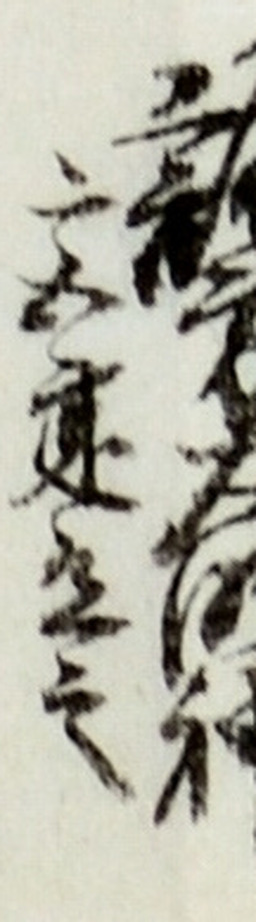宮建有之
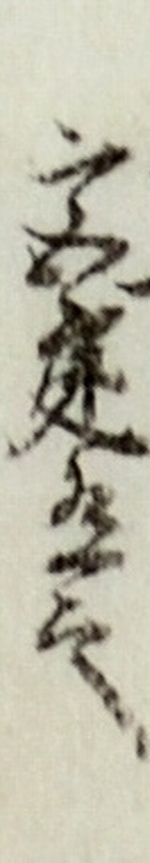宮建有之
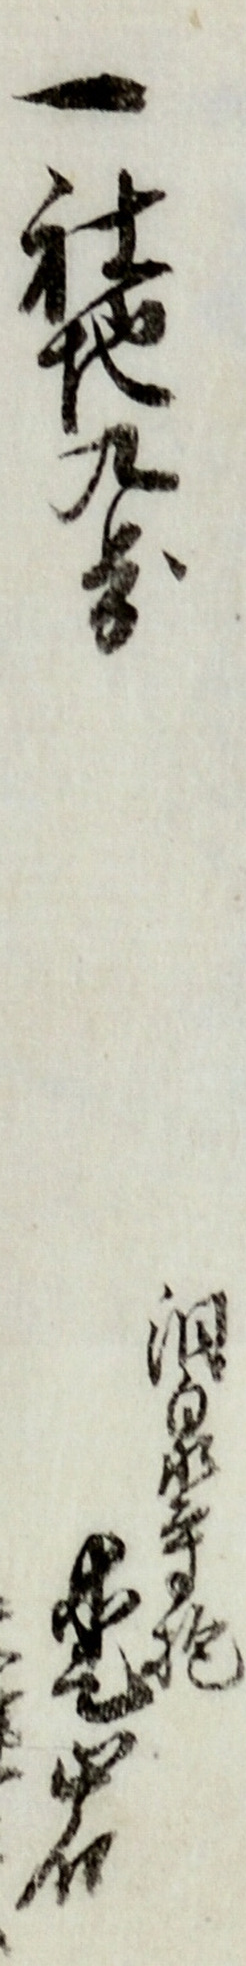一社地九歩愛岩
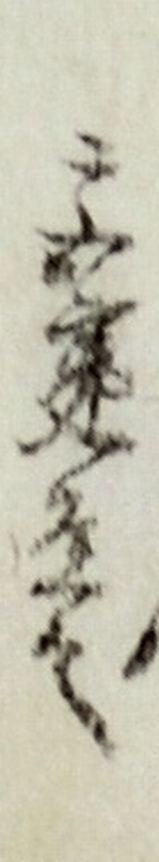宮建有之
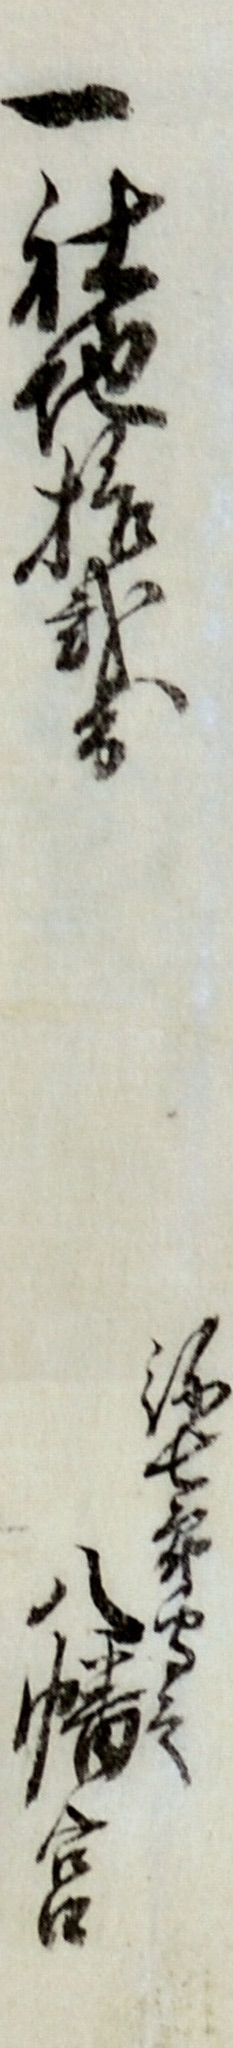一社地拾弐歩八幡宮
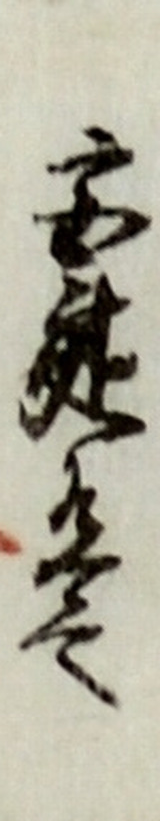宮建有之

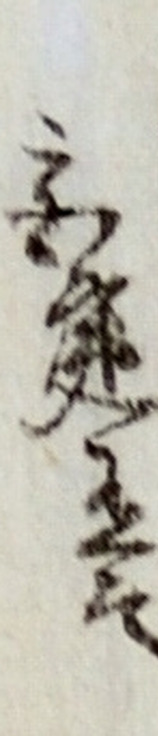宮建有之
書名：御領分中山林社地手控
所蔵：伊那市立高遠町図書館・合同会社AMANE
